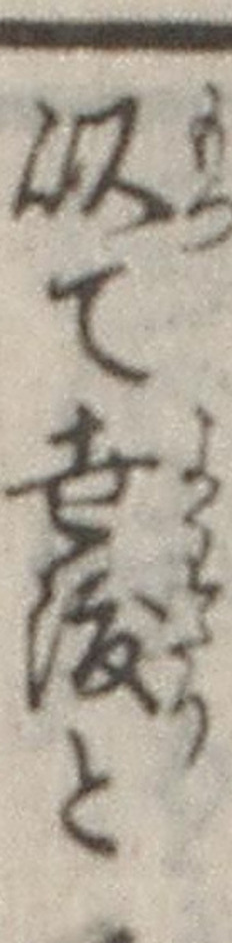以て世渡と
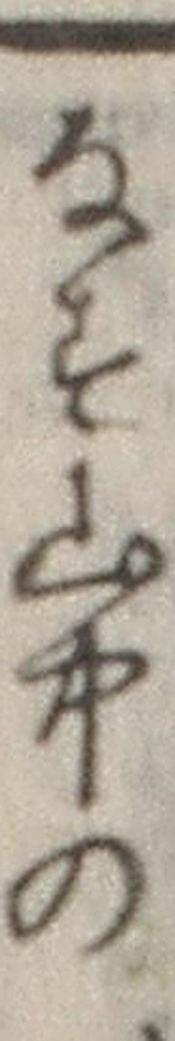なす山中の
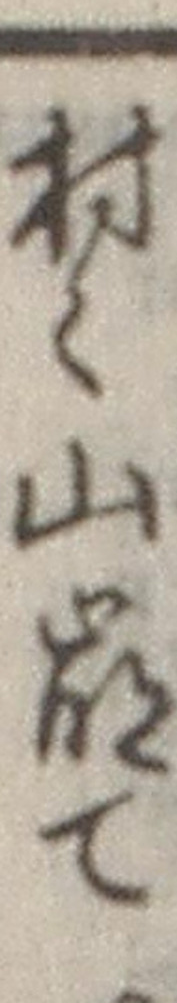村〻山崩て
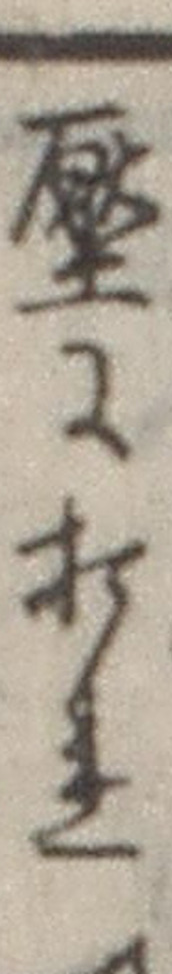圧に打れ
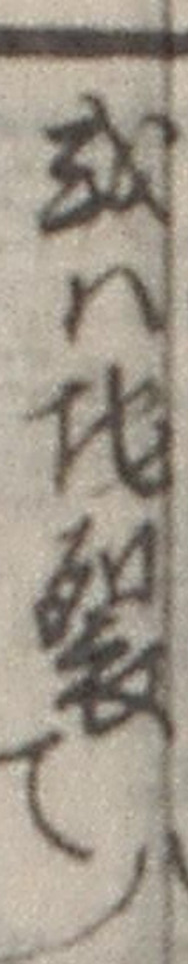或は地裂て
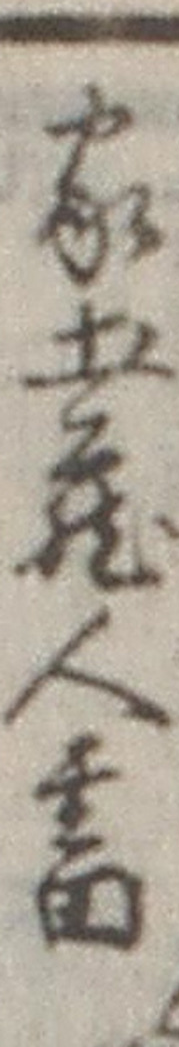家土蔵人畜
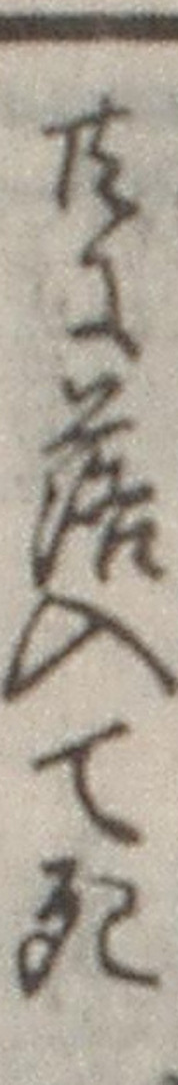共に落入て死
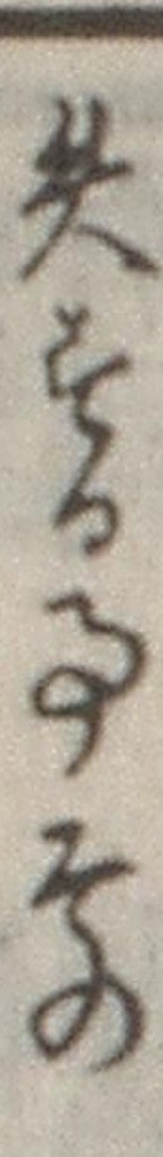失する事その
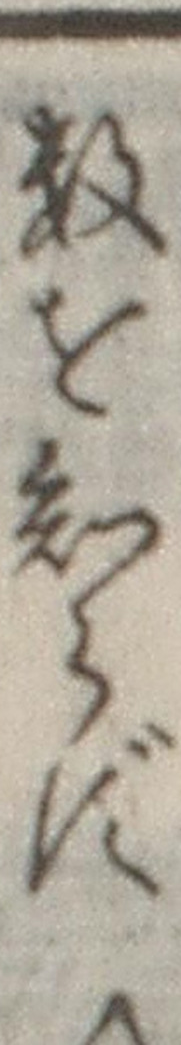数を知らず
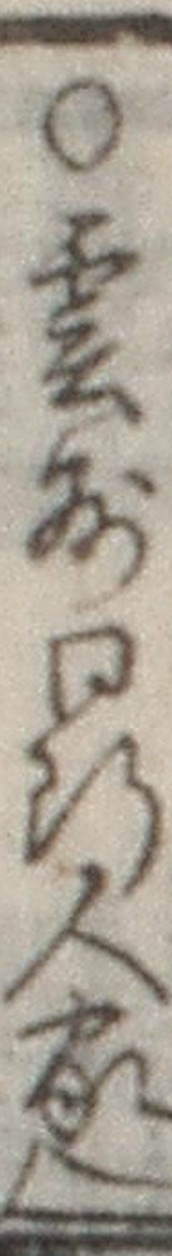◯雲州同段人家
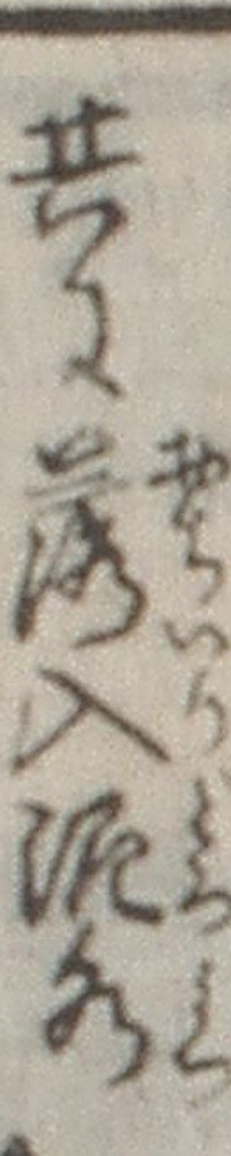共に落入泥水
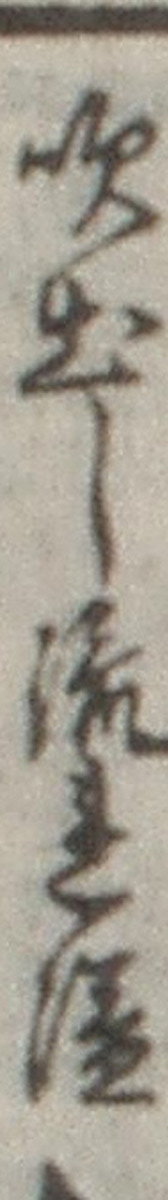吹出し流れ溢
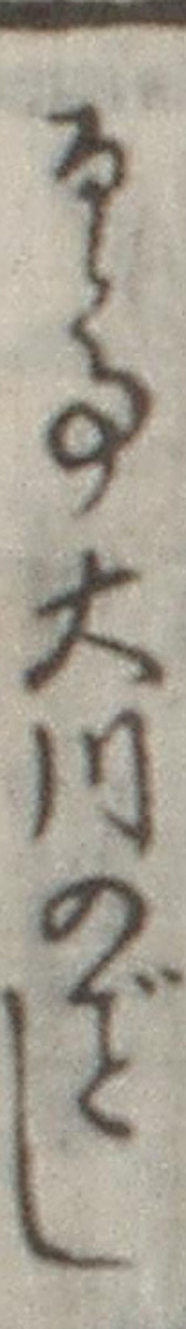るゝ事大川のごとし

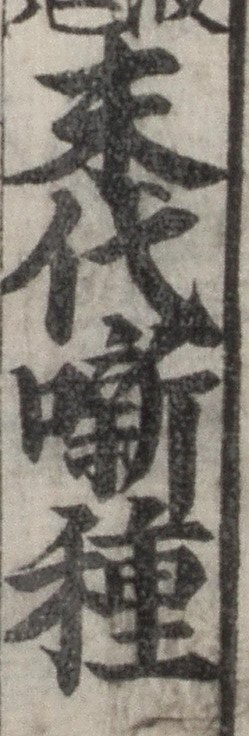末代噺種
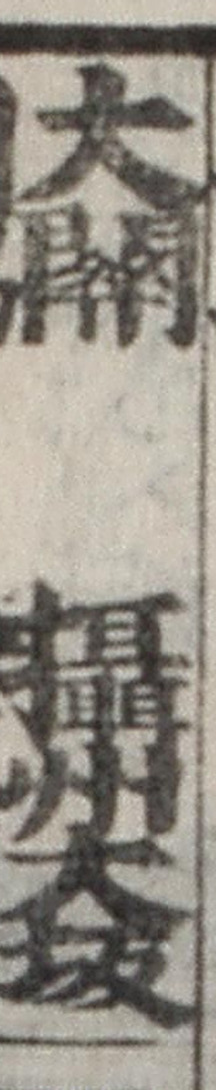大関摂州大坂
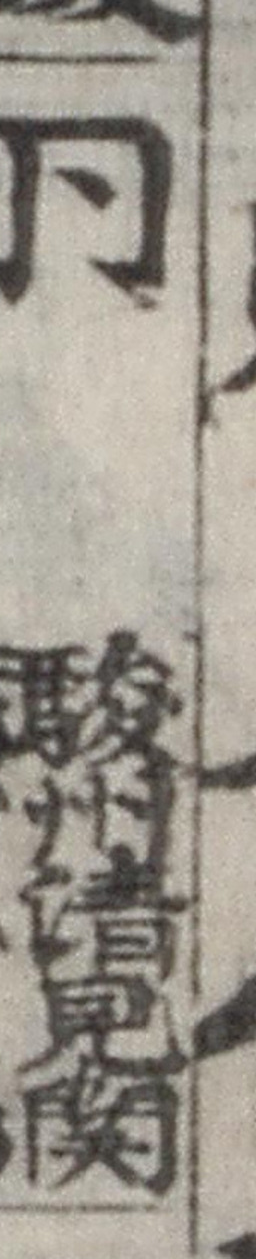同駿州清美関
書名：諸國大地震年代記　末代噺種
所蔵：東京大学地震研究所図書室 Earthquake Research Institute Library, The University of Tokyo, JAPAN
